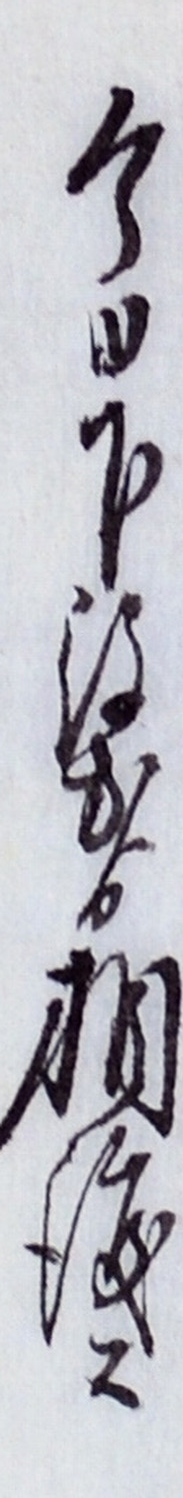今日下役式ゟ相渡ス
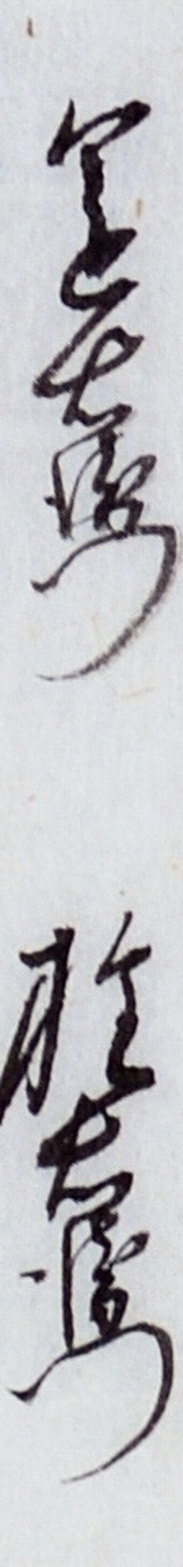金右衛門権右衛門
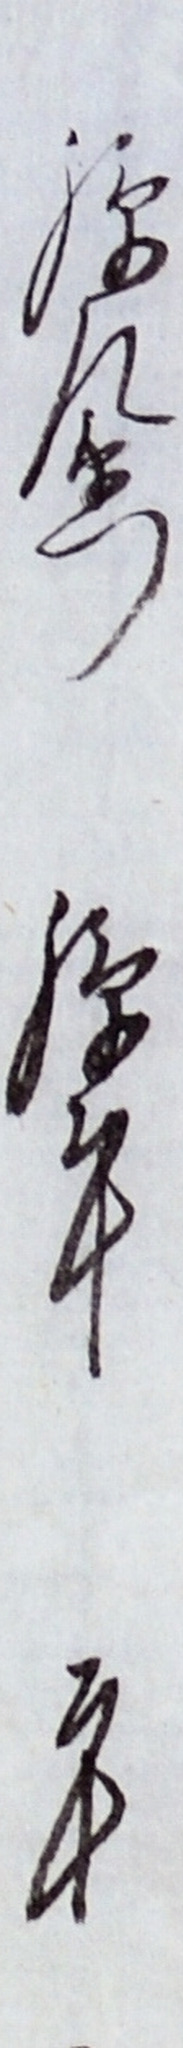源左衛門孫平七
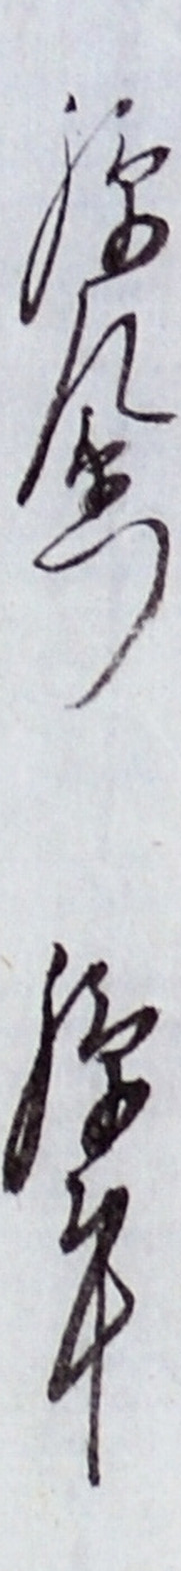源左衛門孫平七
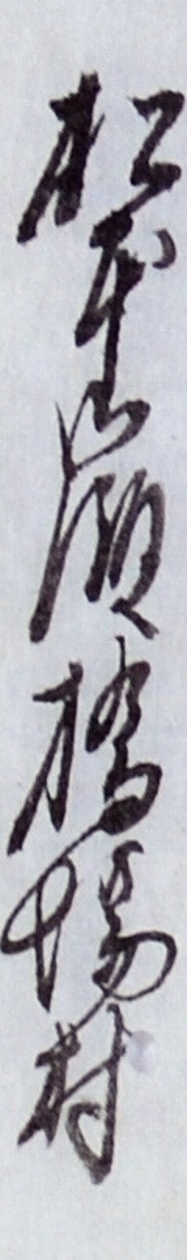松本御領橋場村
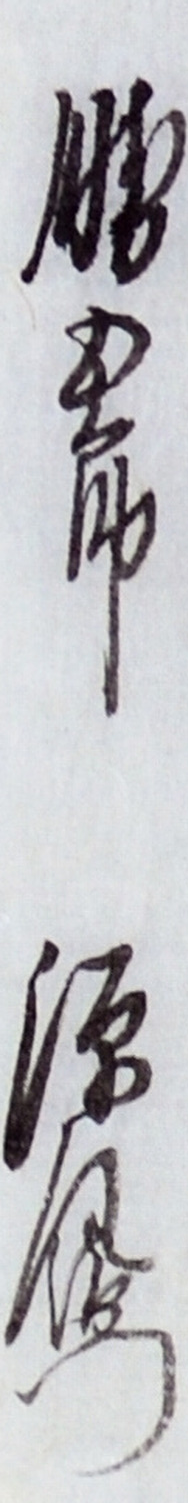勝五郎源左衛門
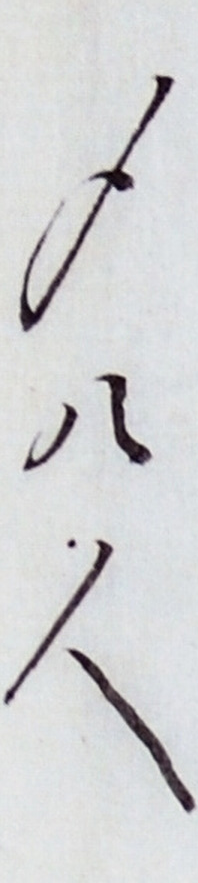〆八人

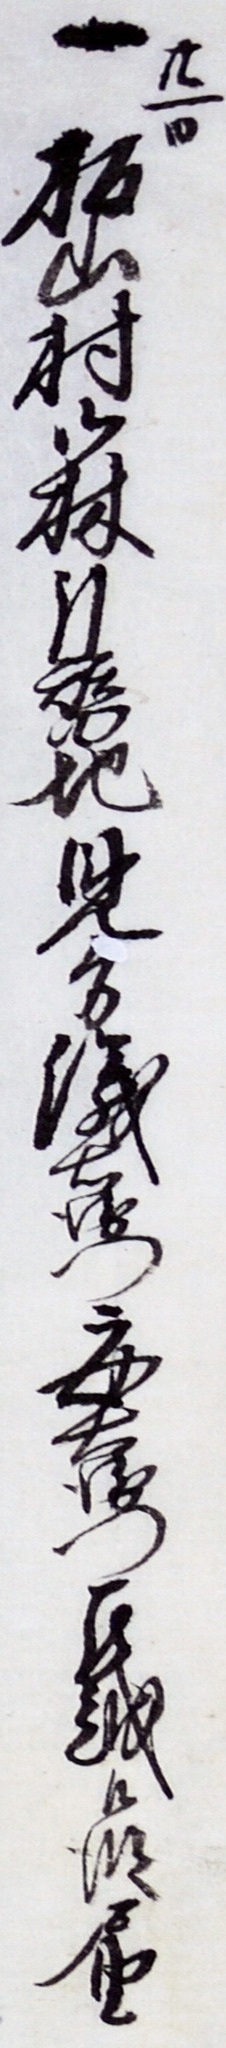一板山村御林引替地見方儀右衛門安右衛門罷越候段届
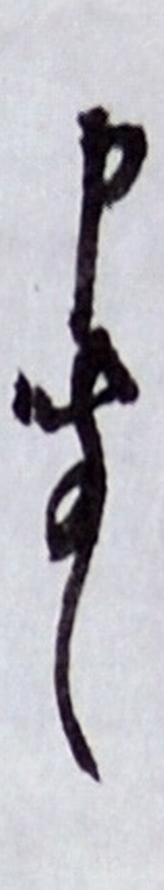申聞候
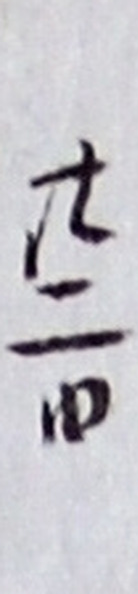廿二日
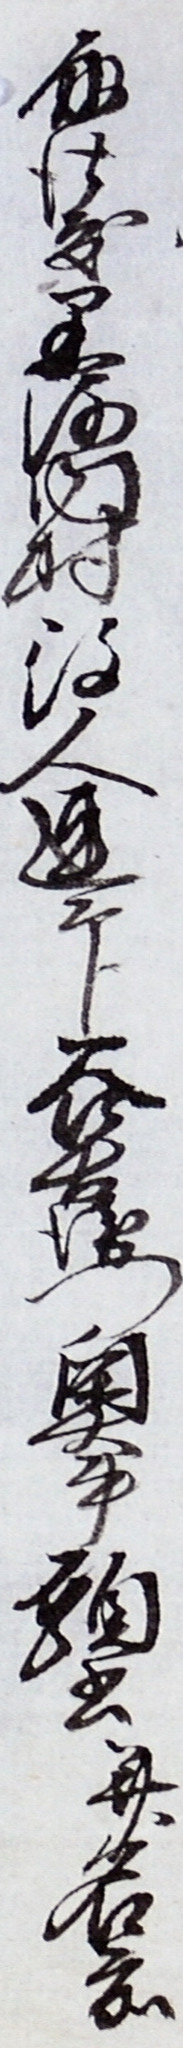届仕度黒河内村役人通印善右衛門奥書願書并名前
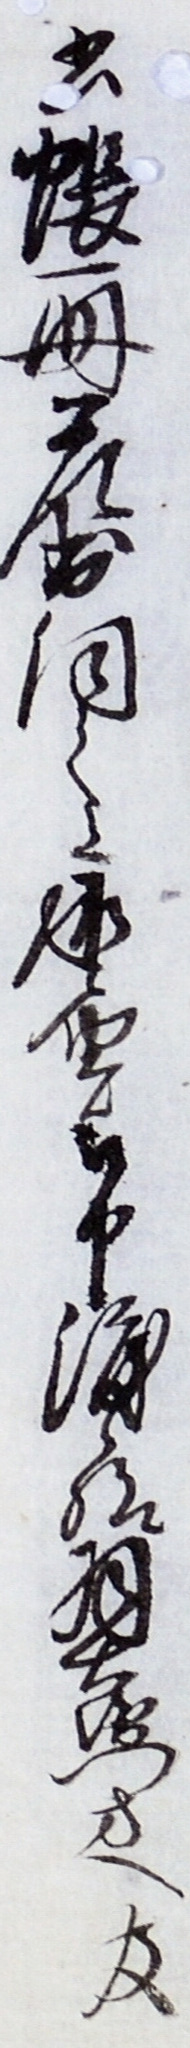書帳一冊差出同之上承届被申渡候様羽右衛門方へ及
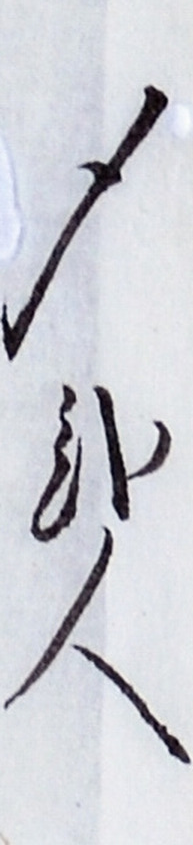〆弐人
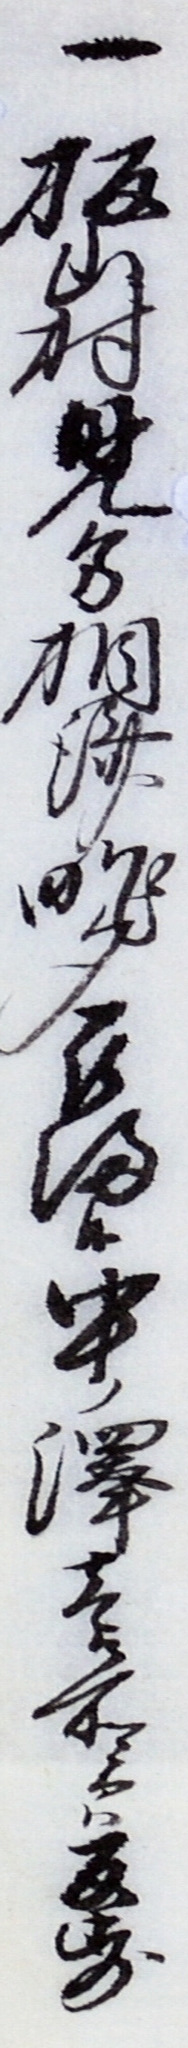一板山村見分相済昨夕罷帰候中ノ澤壱ヶ所ニ而ハ反歩
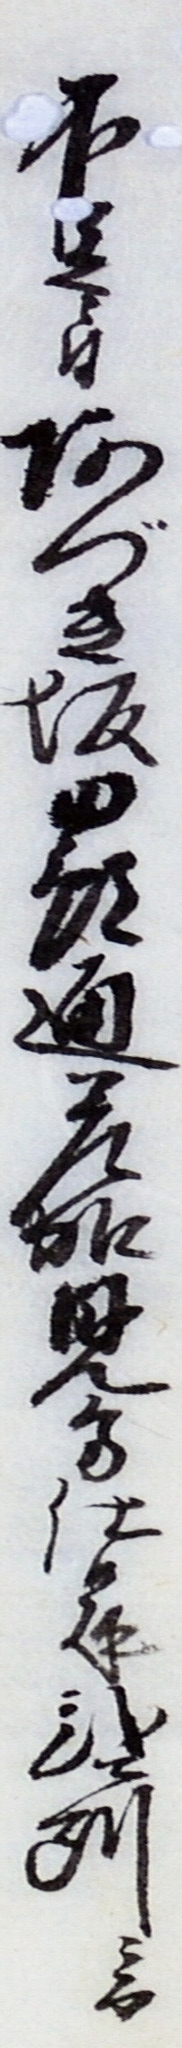不足ニ付あづき坂日朝通差加見方仕候弐ケ所ニ而
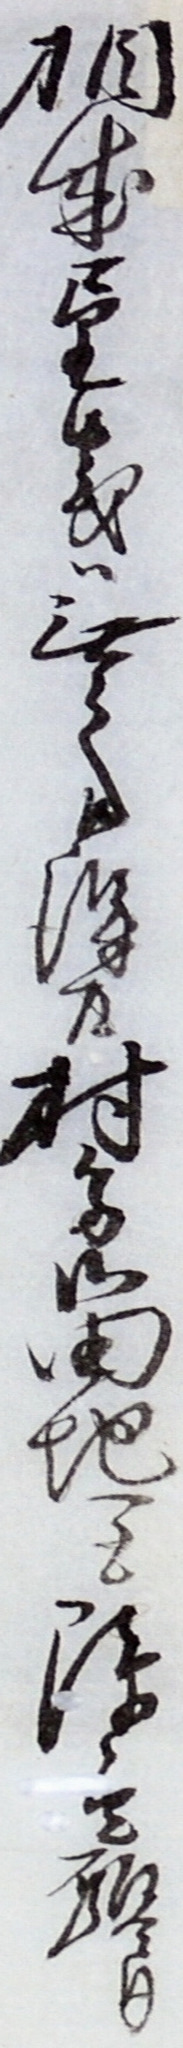相成望候義ハ無之候得共村方御田地へも雖願ニ付
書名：御山奉行御用控
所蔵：伊那市立高遠町図書館・合同会社AMANE
